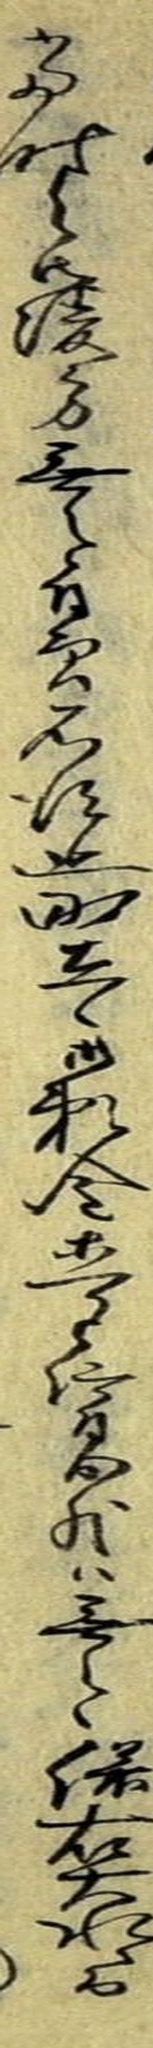当時之御凌方無之ニ付而ハ不得止町在へ御頼金等可被仰付ゟ外ハ無之候併右大水ニ而
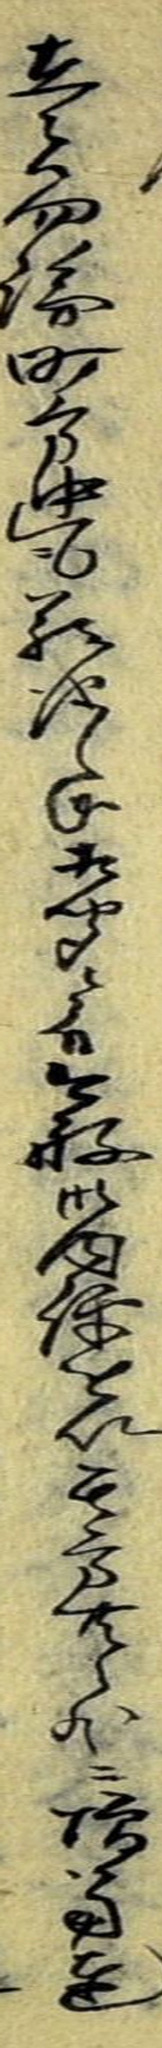在々ハ勿論町方迚も難儀之趣相聞候ニ付今般御内評を以其方共之外ニ増御用達
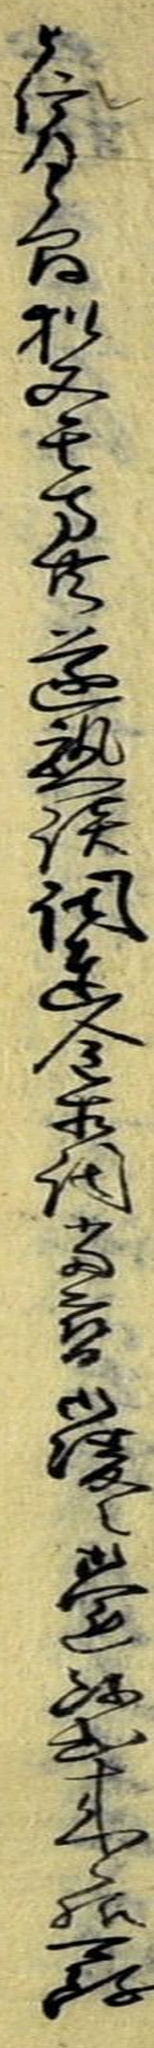被仰付候間猶又其方共遂熟談調達金相調当暮御凌之御運致出来候様可致

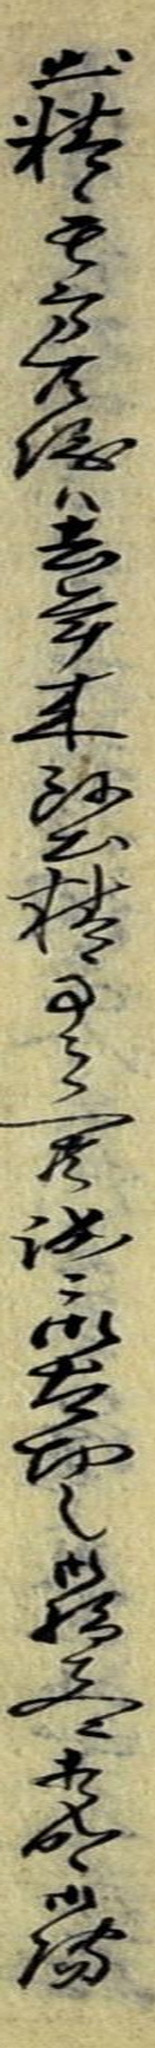出精候其方共儀ハ去年来致出精候事ニ候へ共誠ニ御太切之御指支ニ相成候御場
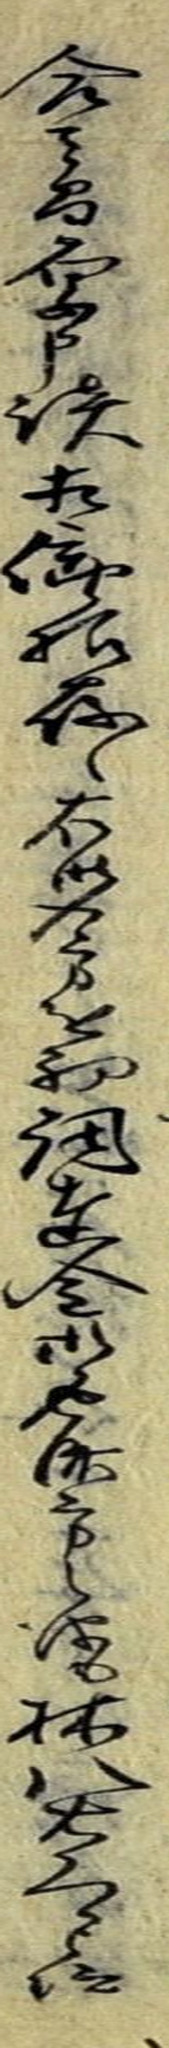合ニ候間厚申談相働様存候右御〆方を初調達金御返済方之儀も林八右衛門へ被仰
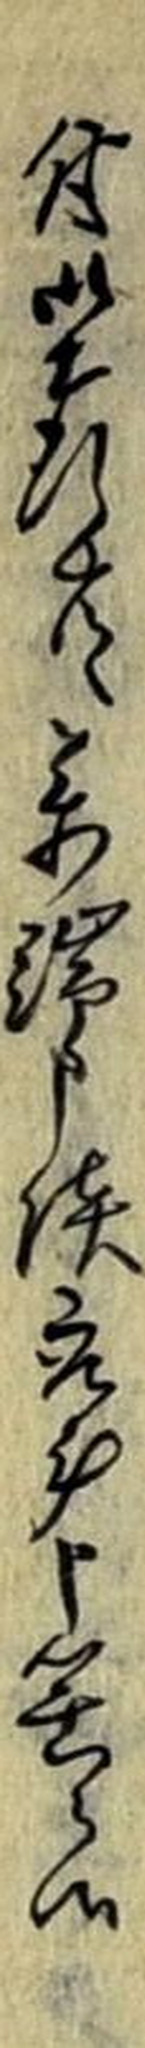付御奉行共へ万端申談取計申筈ニ候
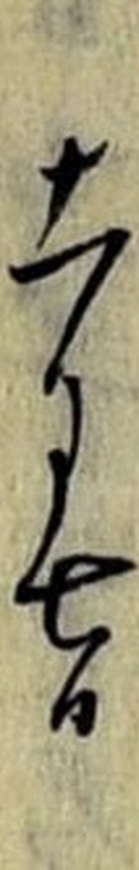十一月七日
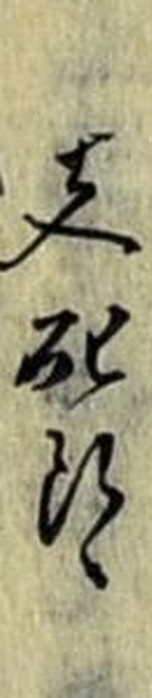支配頭へ
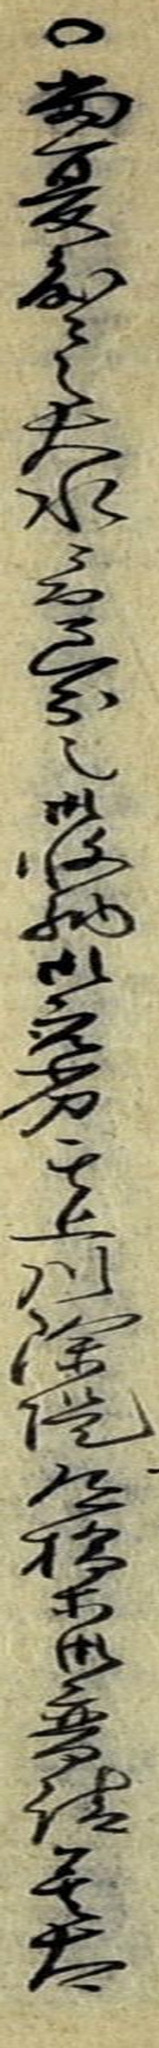〇当夏度々之大水ニ而過分之御収納御取劣其上川除堤道橋等御普請莫太
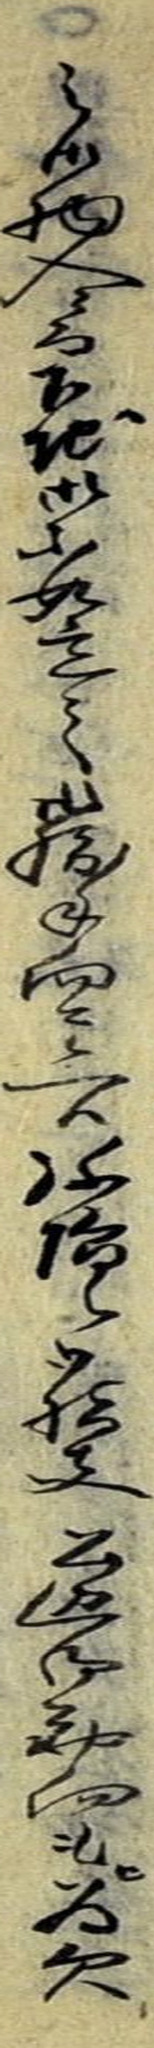之御物入ニ而下地御不如意之御勝手向ニ候ヘハ弥増之御指支公辺御勤向も被為欠
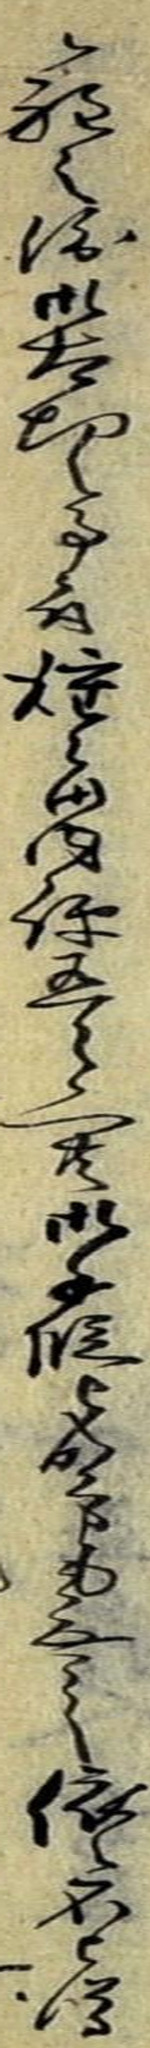候程之儀御太切之事ニ付種々御内評有之候へ共御手段被成方も無之依之不被得
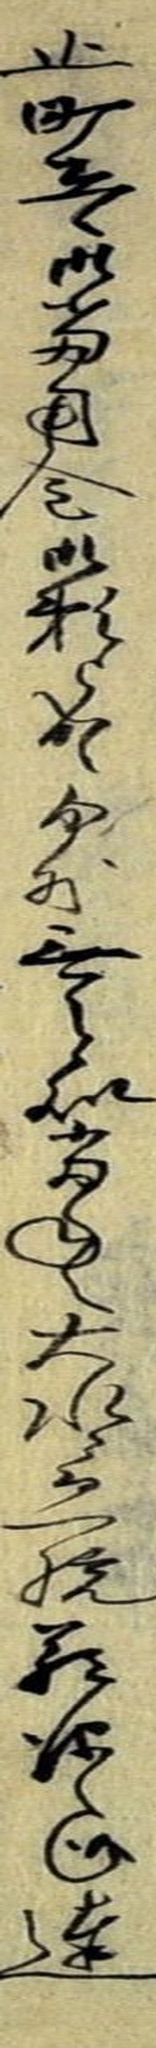止町在へ御当用金御頼被成候ゟ外無之処当年之大水ニ而一統難儀之趣達
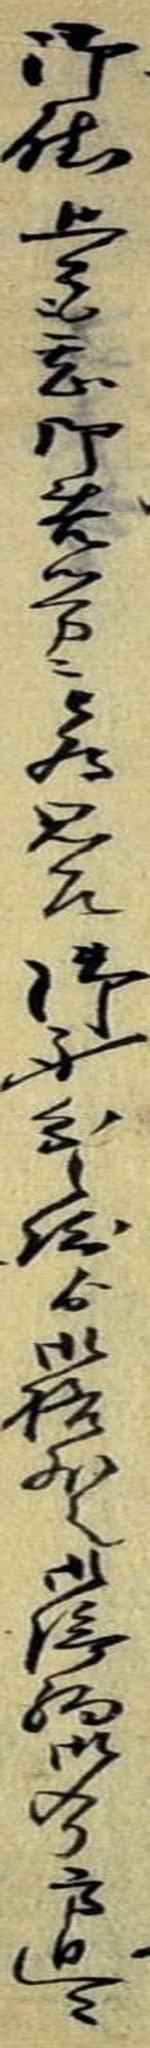御聴上ニも甚御苦労ニ被為思召御身分之儀ゟ御格外之御倹約御〆り方追々
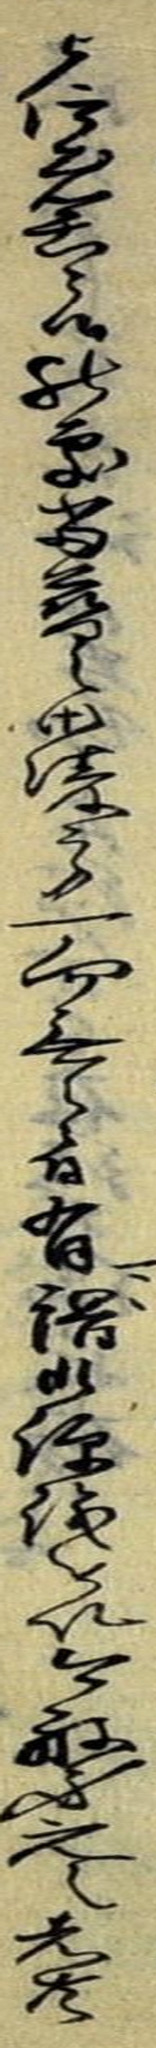被仰出筈ニ候然処当暮之御凌方一向無之ニ付有謂御評議を以今般身元之者共
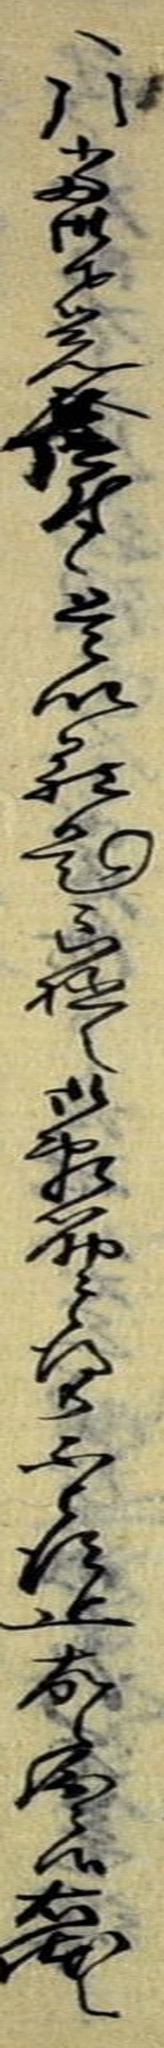へ引当御才覚被仰付候是以難題至極之御頼筋ニ候得共不被得止故之儀ニ候右体之
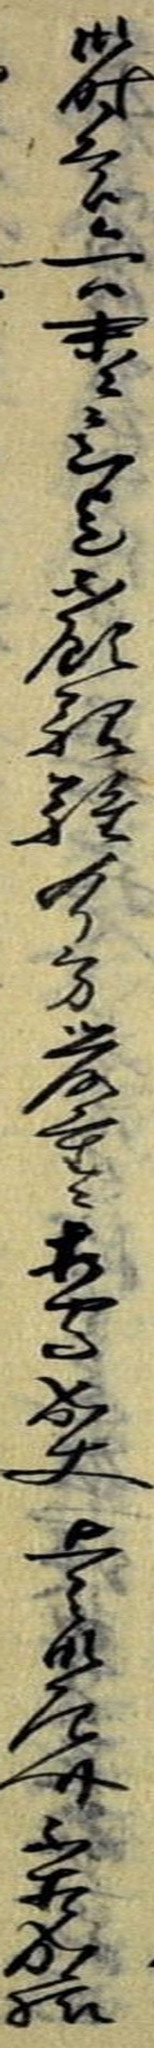御時節ニ候ヘハ末々ニ至迄不顧艱難〆り方厳重ニ相守成丈上之御厄介不相成候様
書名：命令之部 三
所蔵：福井県文書館 Fukui Prefectural Archives
